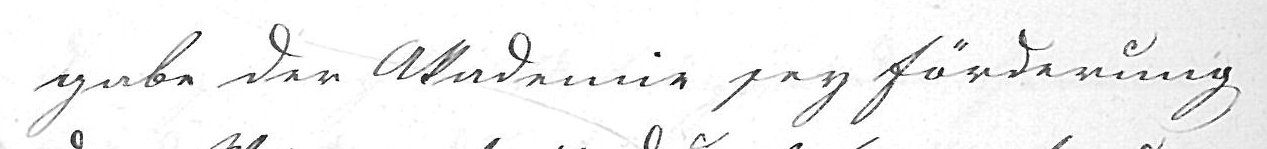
gabe der Akademie sey Förderung
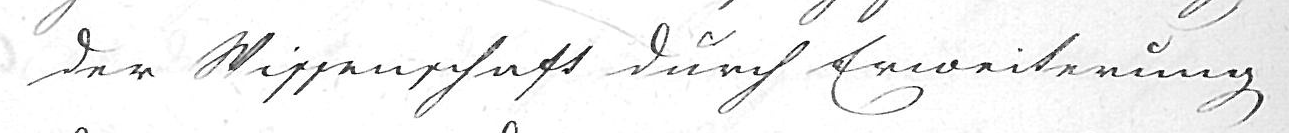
der Wissenschaft durch Erweiterung
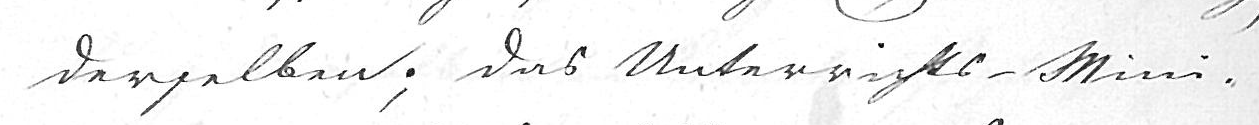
derselben; das Unterrichts-Mini-
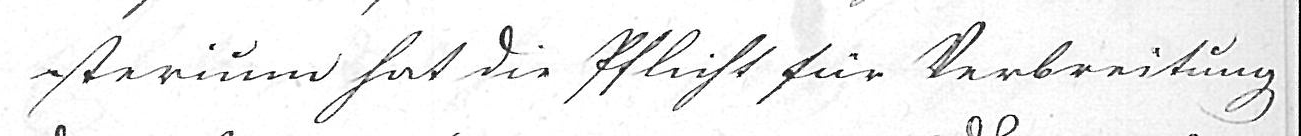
sterium hat die Pflicht für Verbreitung
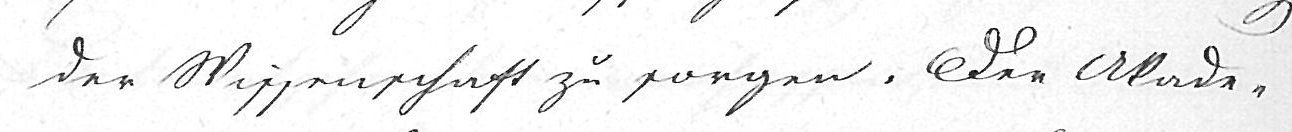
der Wissenschaft zu sorgen. Der Akade-
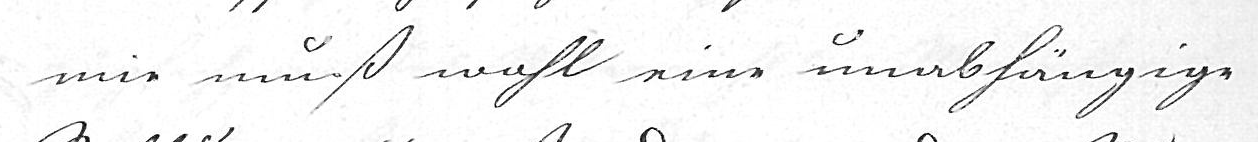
mie muß wohl eine unabhängige
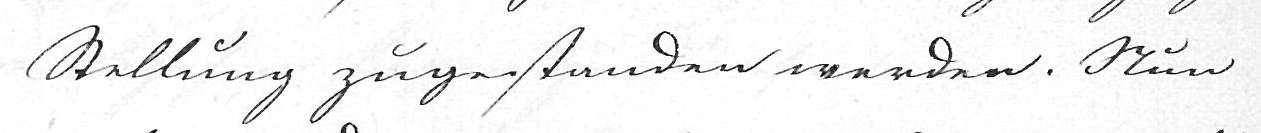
Stellung zugestanden werden. Nun
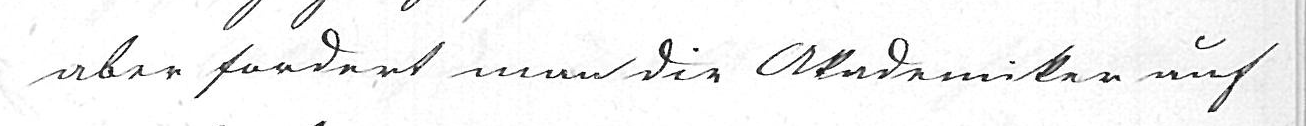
aber fordert man die Akademiker auf
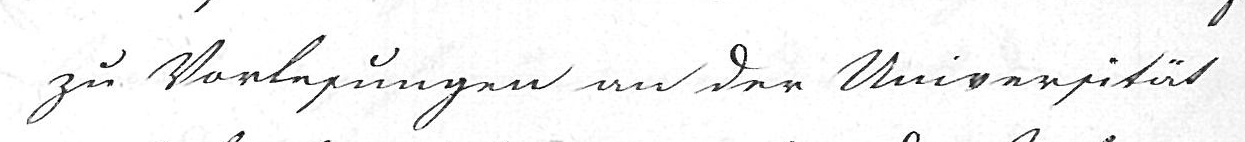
zu Vorlesungen an der Universität
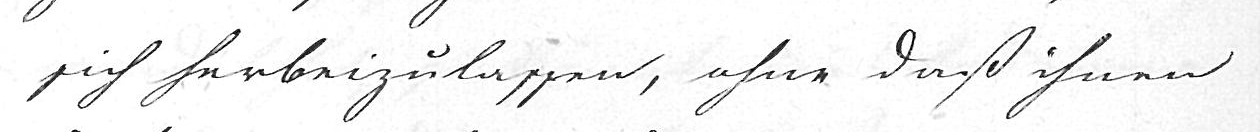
sich herbeizulassen, ohne daß ihnen
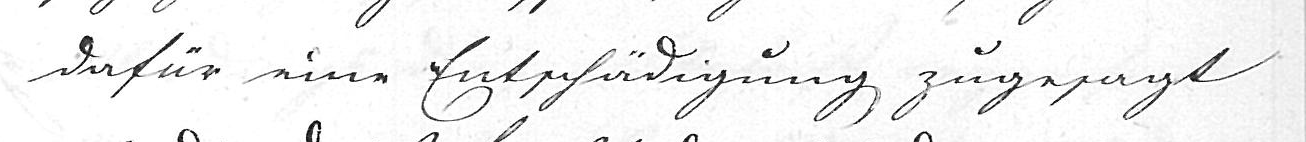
dafür eine Entschädigung zugesagt
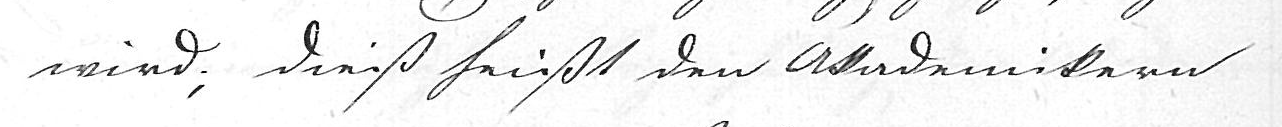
wird; dieß heißt den Akademikern
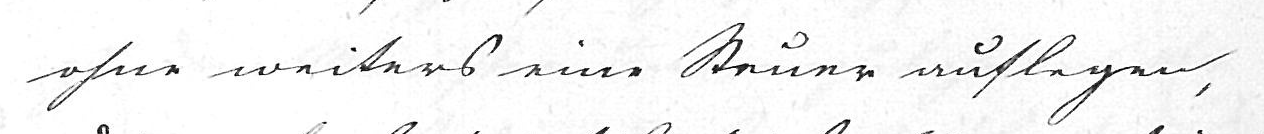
ohne weiters eine Steuer auflegen,
